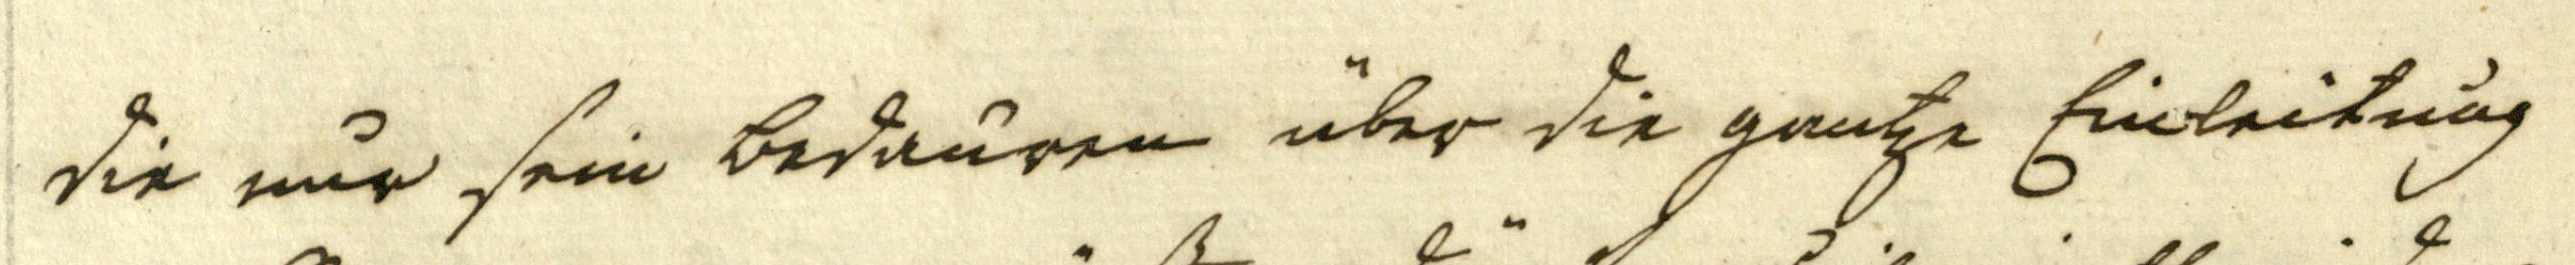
die nur sein Bedauren über die gantze Einleitung
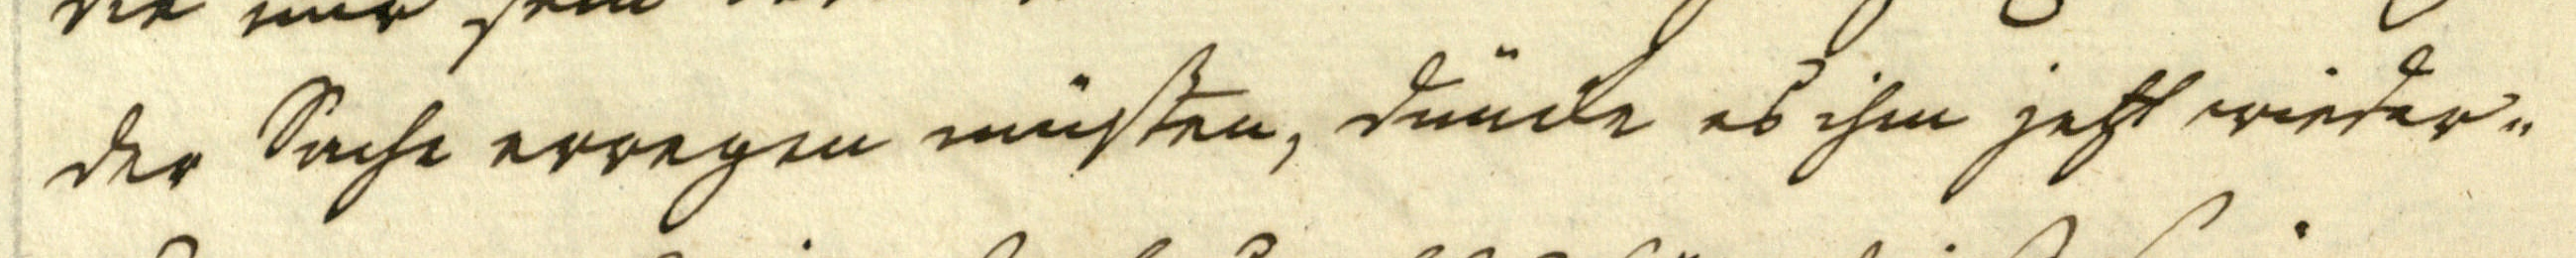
der Sache erregen müßten, düncke es ihm jetzt wieder¬
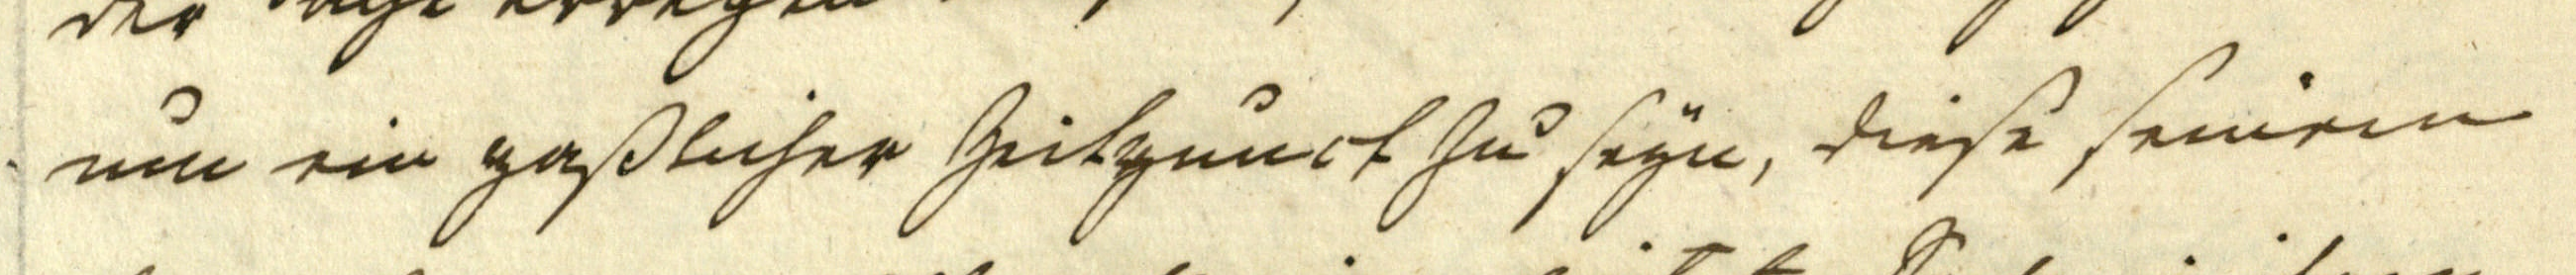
um ein paßlicher Zeitpunct zu seÿn, diese seinem
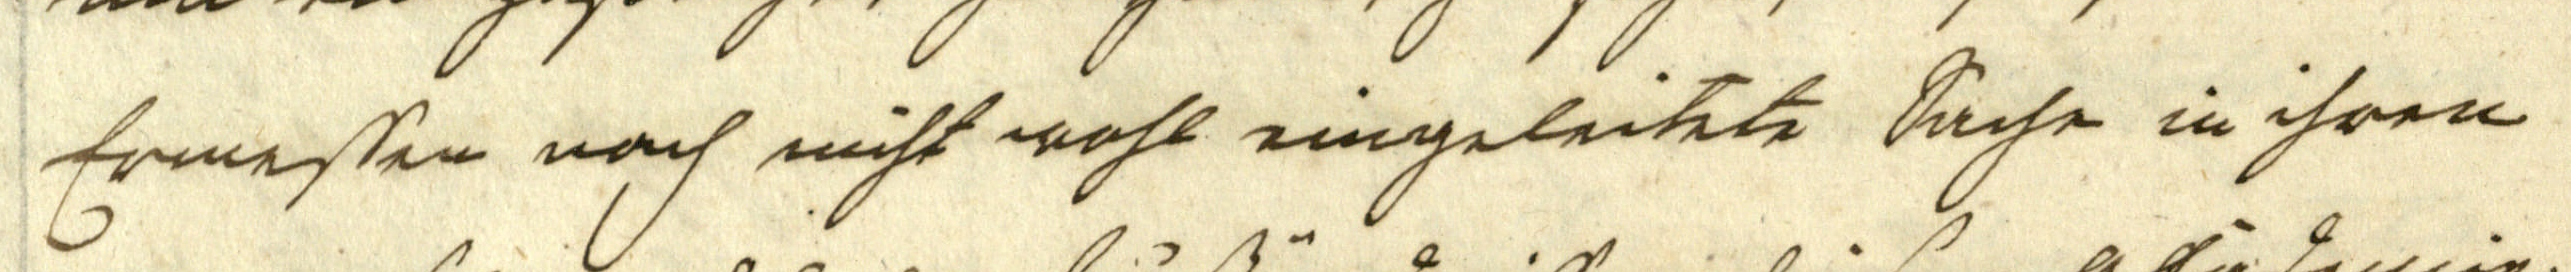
Ermessen nach nicht wohl eingeleitete Sache in ihren
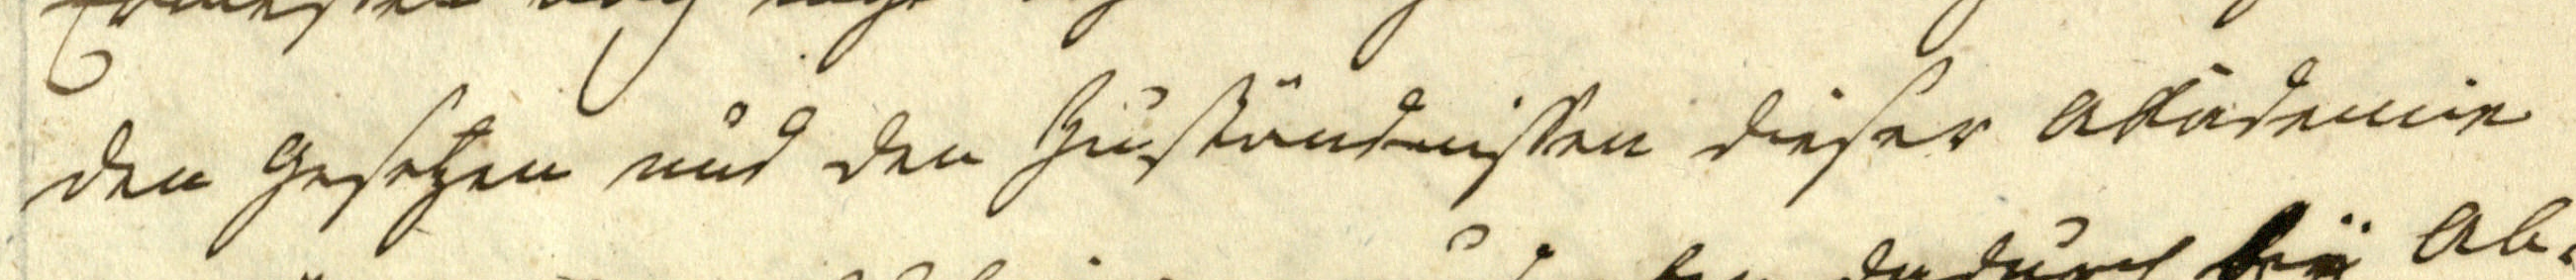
den Gesetzen und den Zuständnissen dieser Akademie
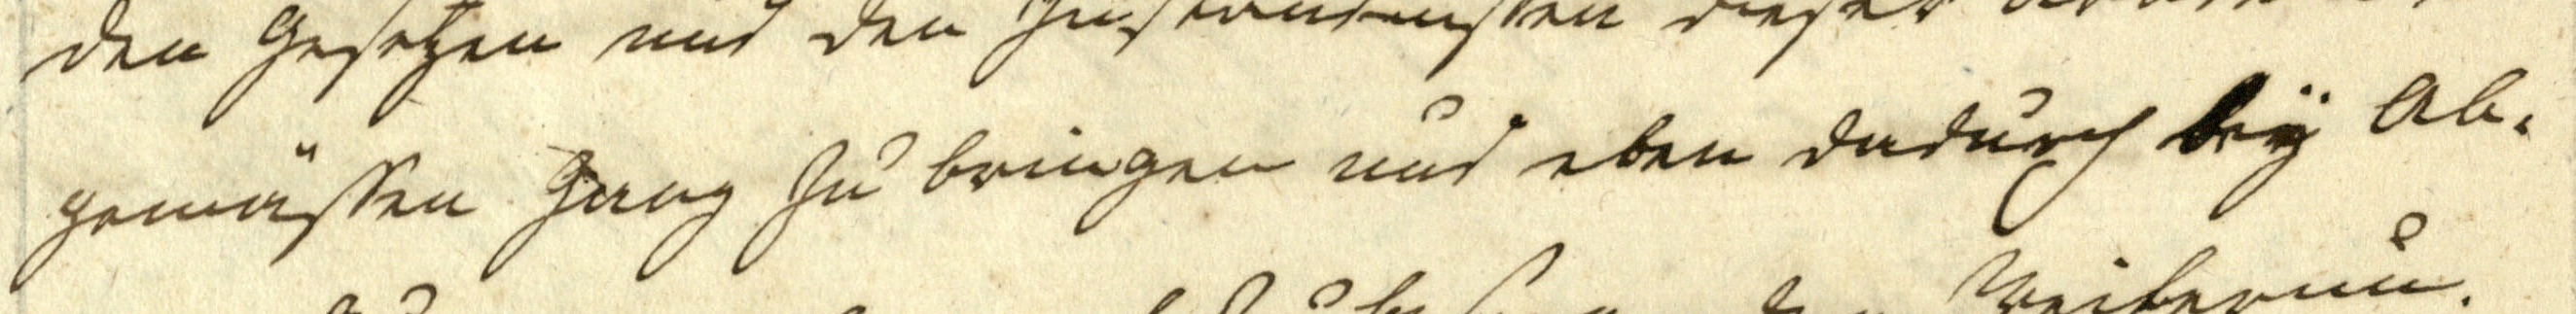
gemässen Gang zu bringen und eben dadurch beÿ Ab¬
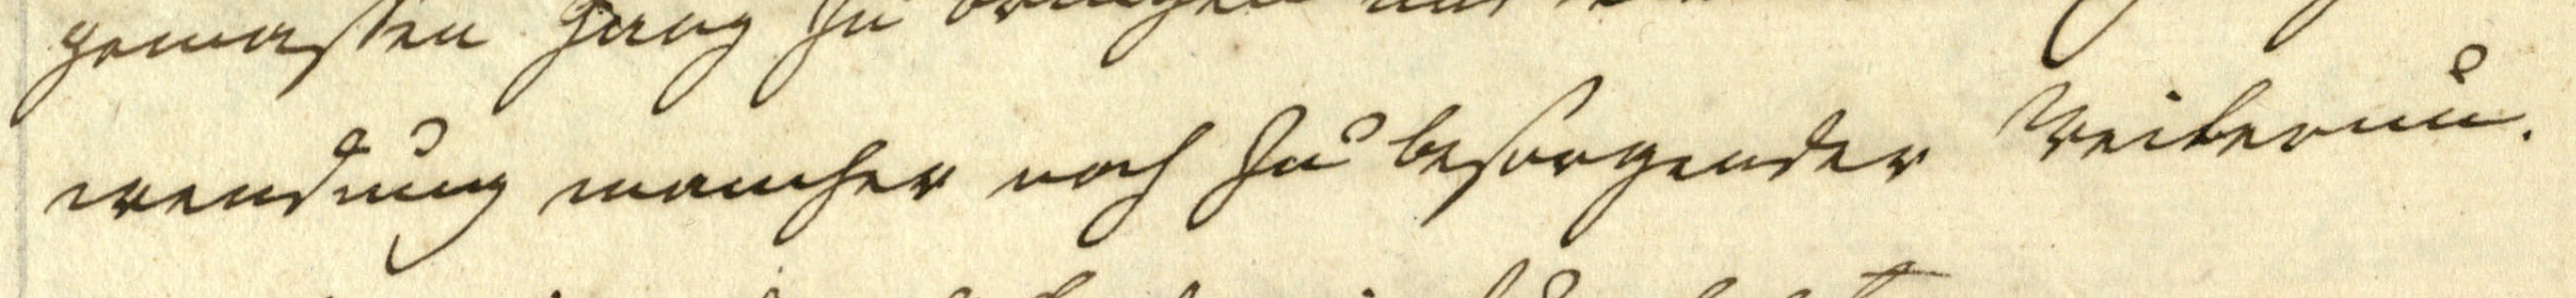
wendung mancher noch zu besorgender Weiterun¬
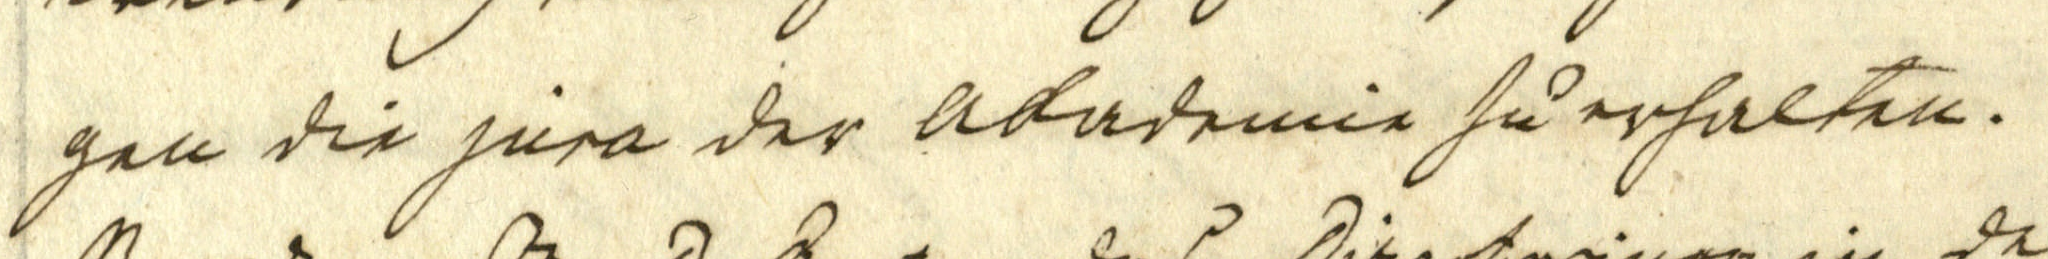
gen die jura der Akademie zu erhalten.
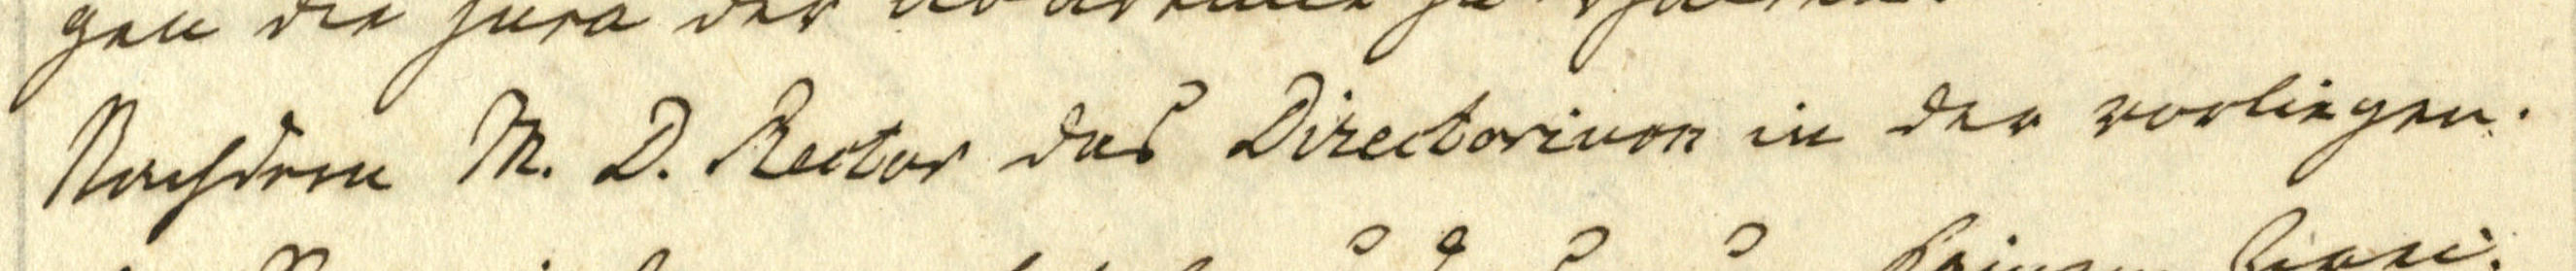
Nachdem M. D. Rector das Directorium in der vorliegen¬
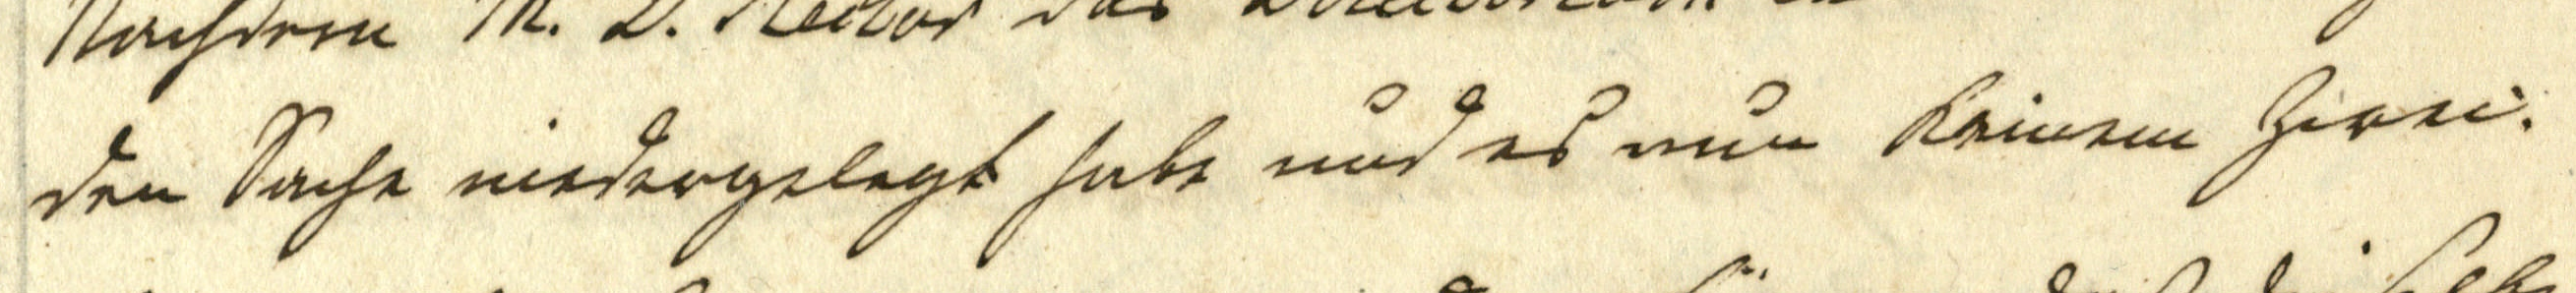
den Sache niedergelegt habe und es nun keinem Zwei¬
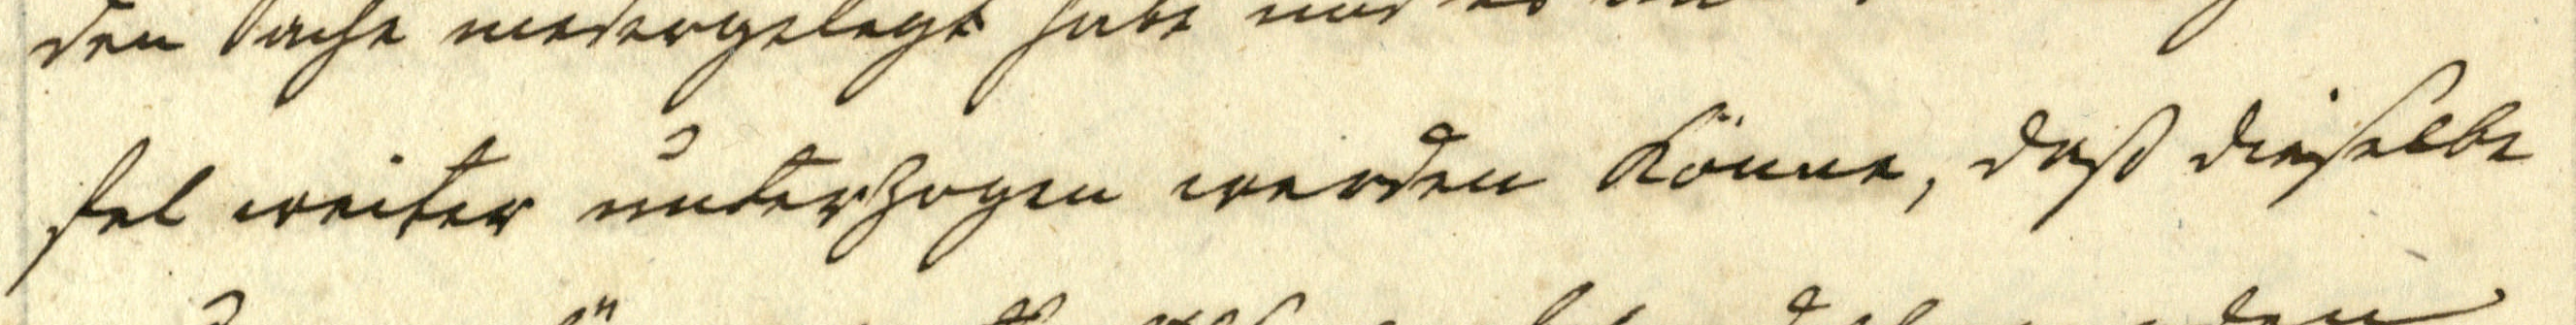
fel weiter unterzogen werden könne, daß dieselbe
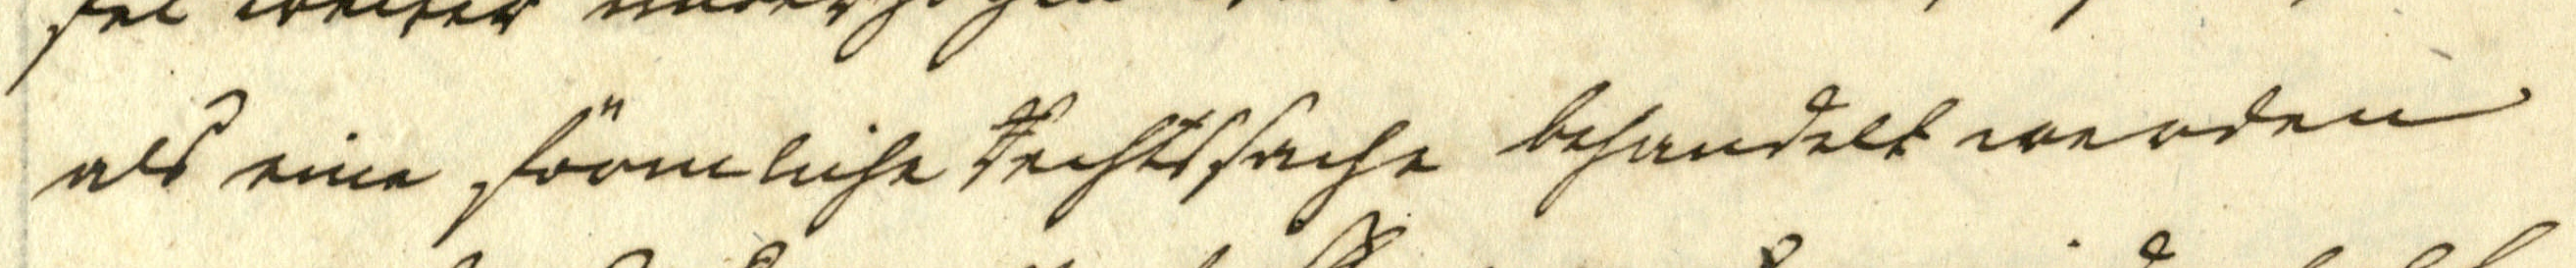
als eine förmliche Rechtssache behandelt werden
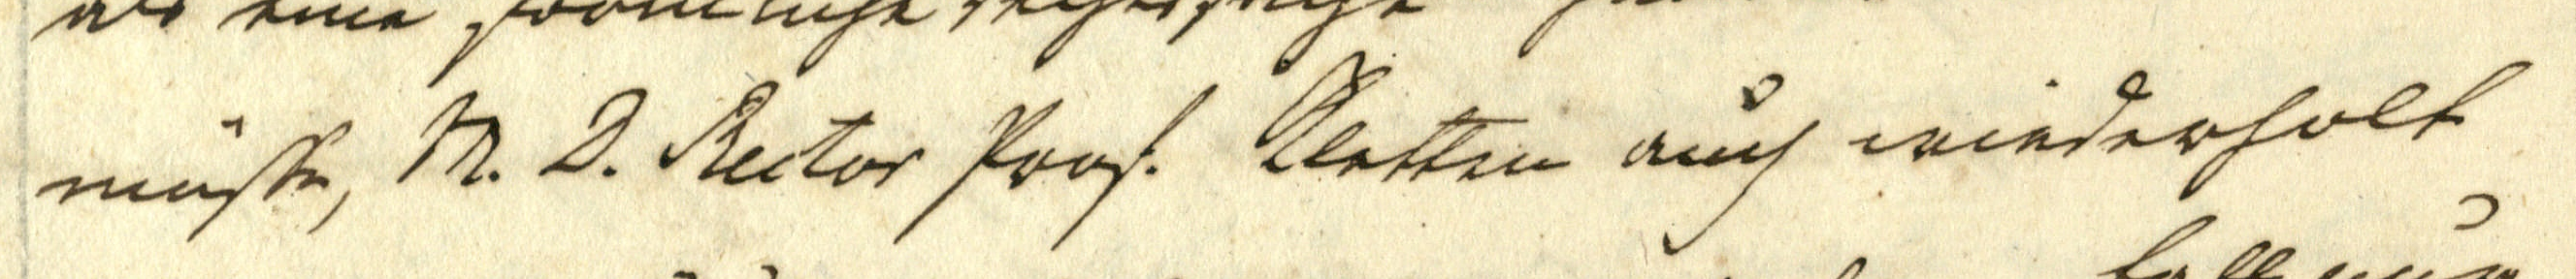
müsse, M. D. Rector Prof. Kletten auch wiederholt
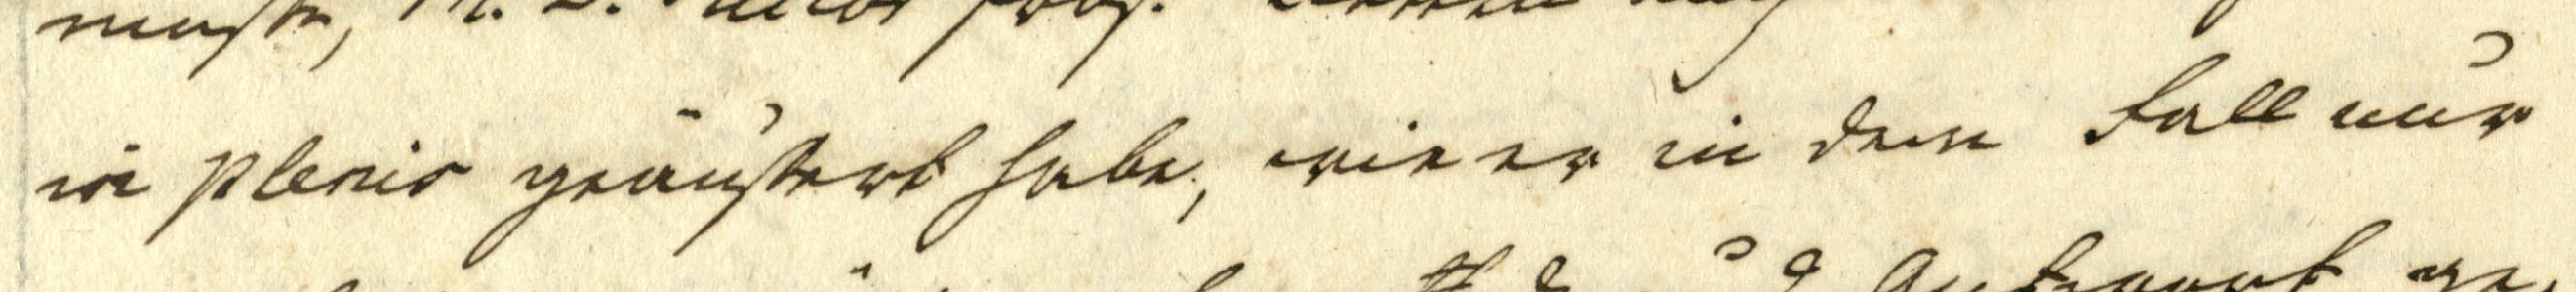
in plenis geäussert habe, wie er in dem Fall nur
